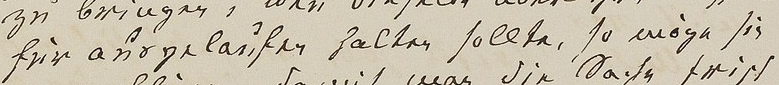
für ausgelaufen halten sollte, so möge sie
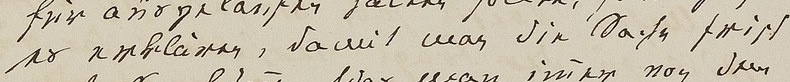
es erklären, damit man die Sache frisch
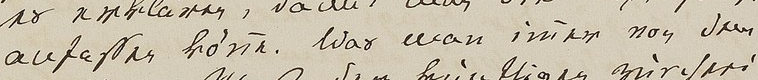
anfassen könne. Was man immer von dem
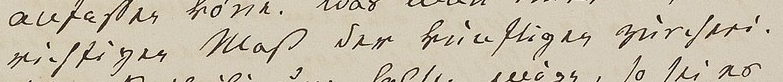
richtigen Maß der künftigen zürcheri-
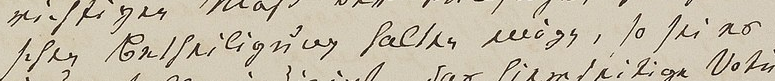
schen Betheiligung halten möge, so sei es
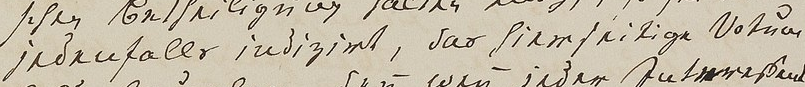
jedenfalls indizirt, das hierseitige Votum
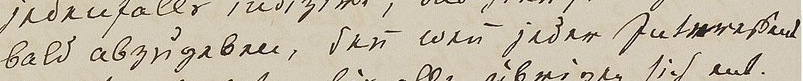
bald abzugeben, denn wenn jeder Interessent
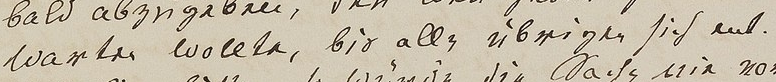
warten wollte, bis alle übrigen sich ent-
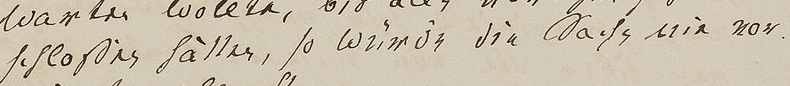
schlossen hätten, so würde die Sache nie vor-
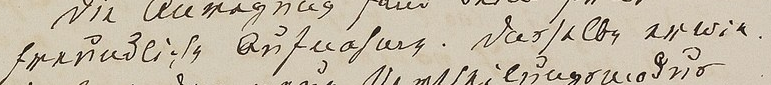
freundliche Aufnahme. Dasselbe erwie-
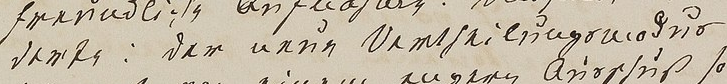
derte: Der neue Vertheilungsmodus
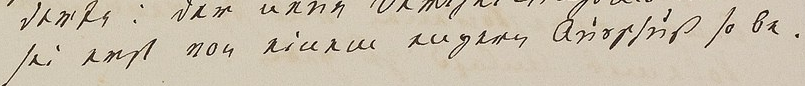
sei erst von einem engern Ausschuß so be-
